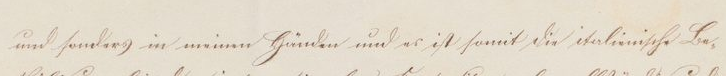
und sonders in meinen Händen und es ist somit die italienische Be-
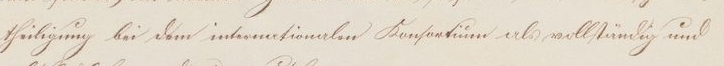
theiligung bei dem internationalen Konsortium als vollständig und
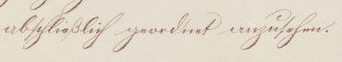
abschließlich geordnet anzusehen.
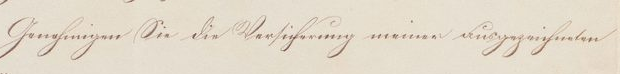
Genehmigen Sie die Versicherung meiner ausgezeichneten
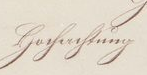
Hochachtung
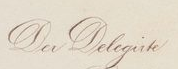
Der Delegirte
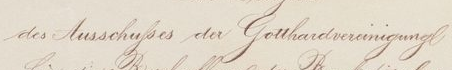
des Ausschusses der Gotthardvereinigung
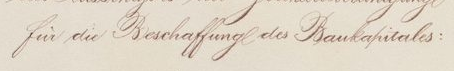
für die Beschaffung des Baukapitales:
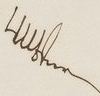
Escher
